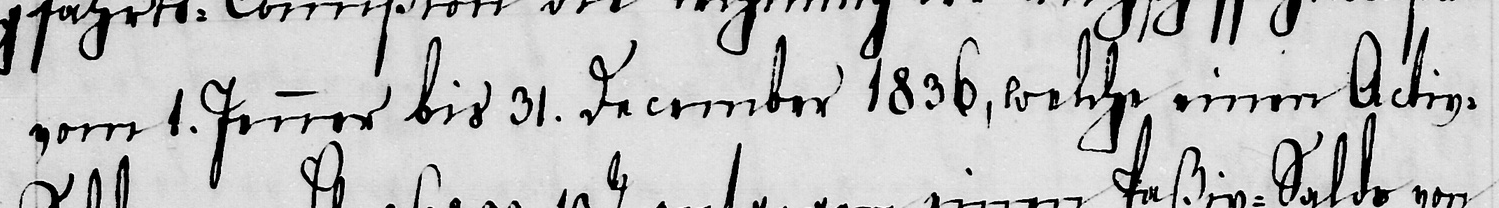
vom 1. Jenner bis 31. December 1836, welche einen Acti¬
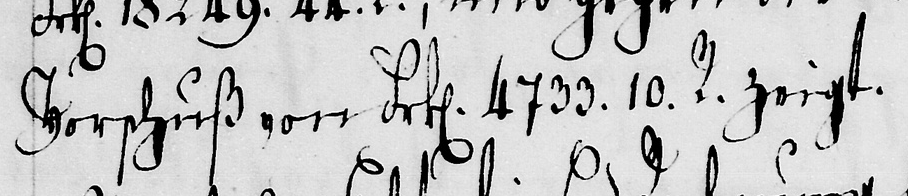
Vorschuß von Frk[en]. 4735.10. R. zeigt.
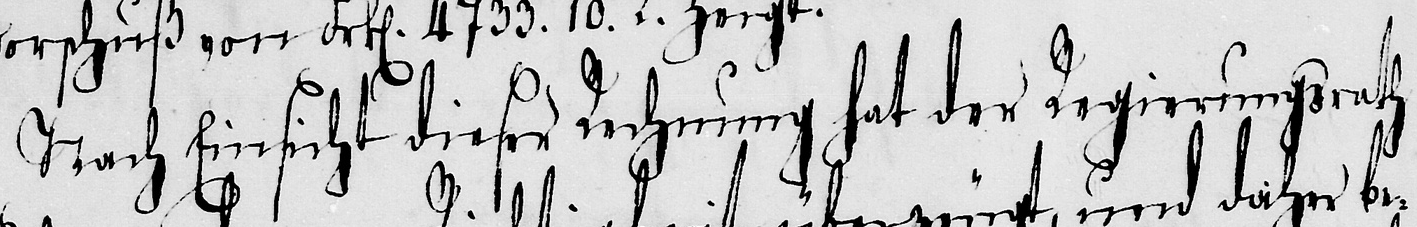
Nach Einsicht dieser Rechnung hat der Regierungsrath
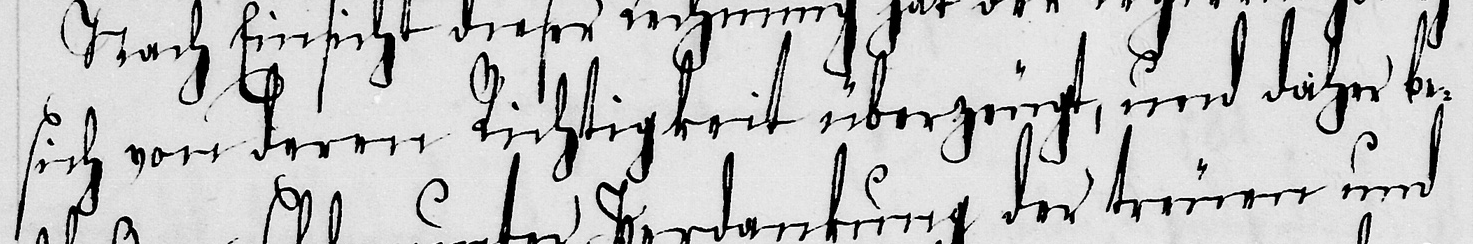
sich von deren Richtigkeit überzeugt, und daher be¬
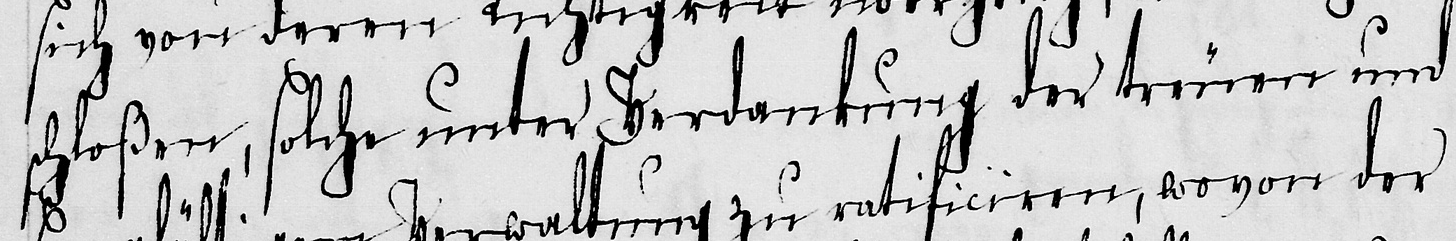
schloßen, solche unter Verdankung der treuen und
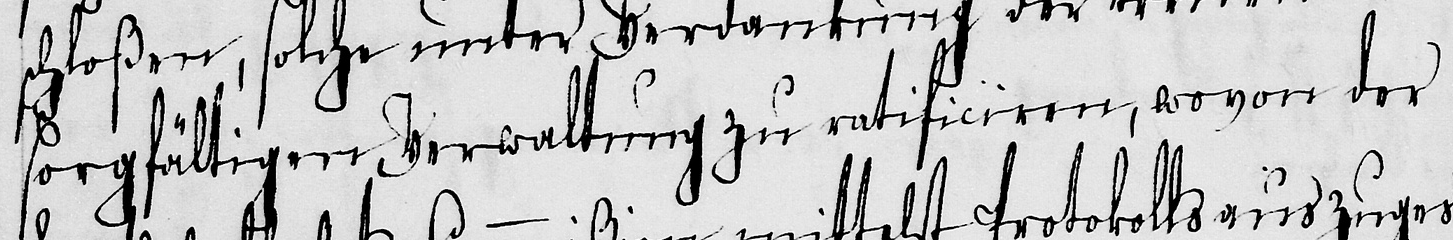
sorgfältigen Verwaltung zu ratificiren, wovon der
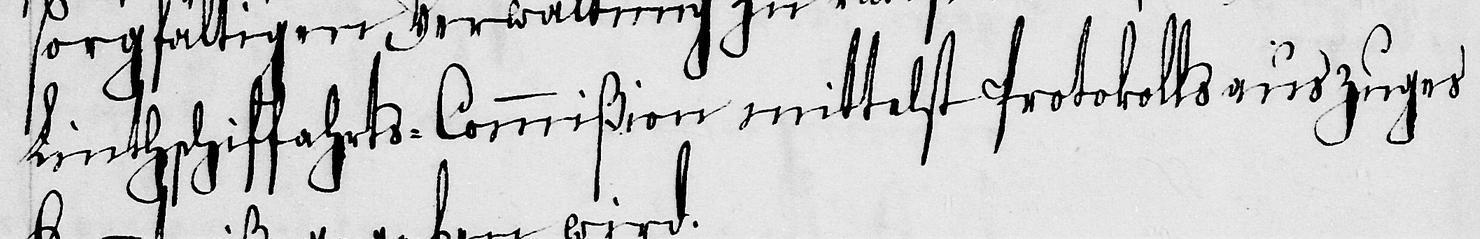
Linthschiffahrts-Commißion mittelst Protokollsauszuges
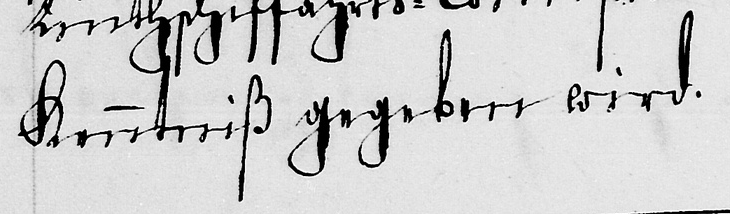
Kenntniß gegeben wird.
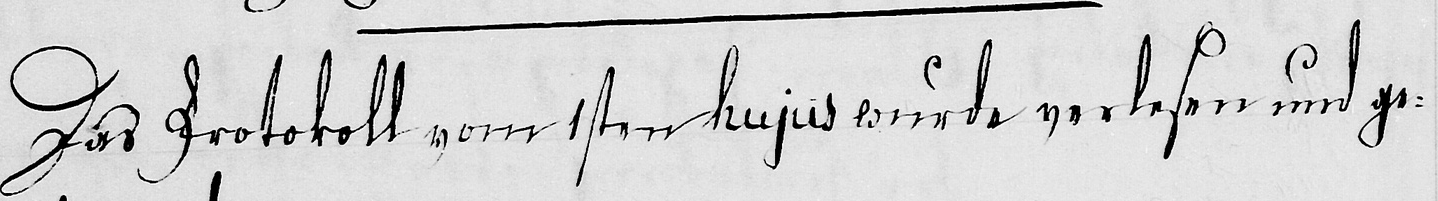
Das Protokoll vom 1sten hujus wurde verlesen und ge¬
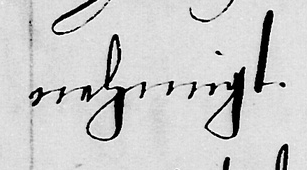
nehmigt.
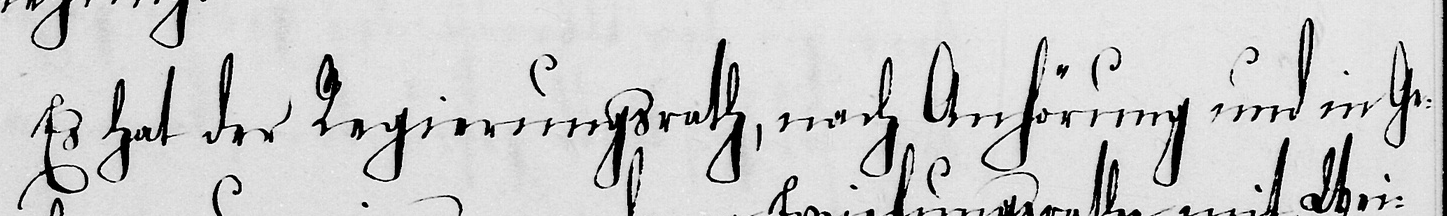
Es hat der Regierungsrath, nach Anhörung und in Ge¬
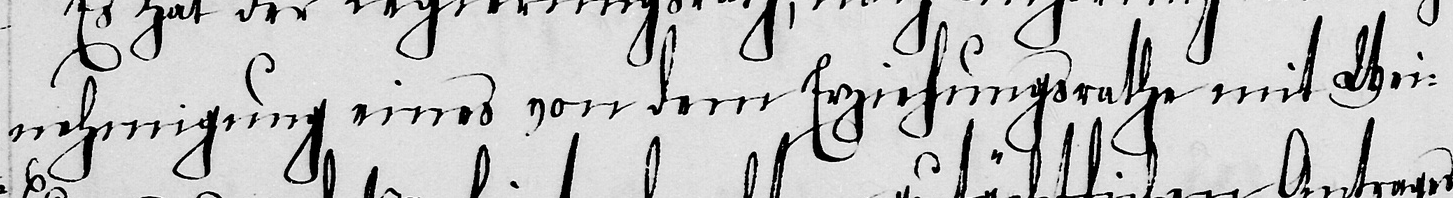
nehmigung eines von dem Erziehungsrathe mit Wei¬
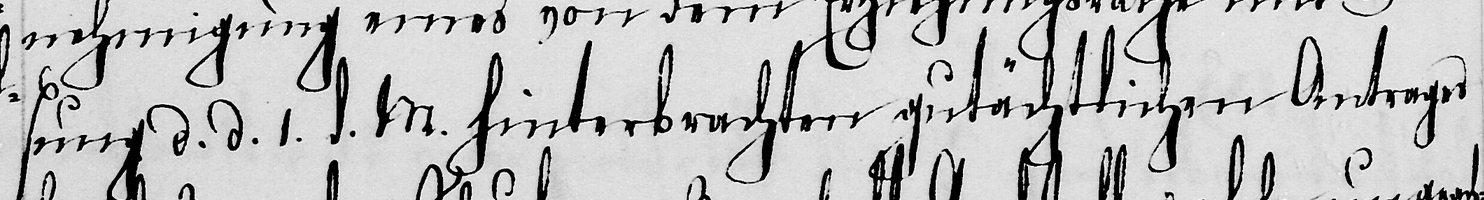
sung d. d. 1. d. M. hinterbrachten gutächtlichen Antrages
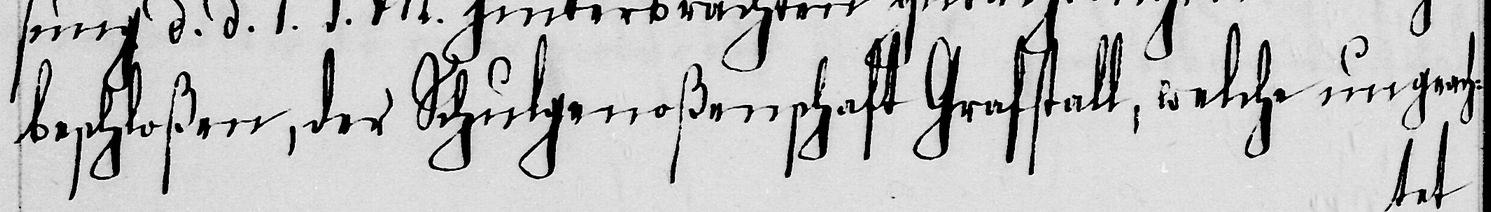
beschloßen, der Schulgenoßenschaft Grafstall, welche unge¬
